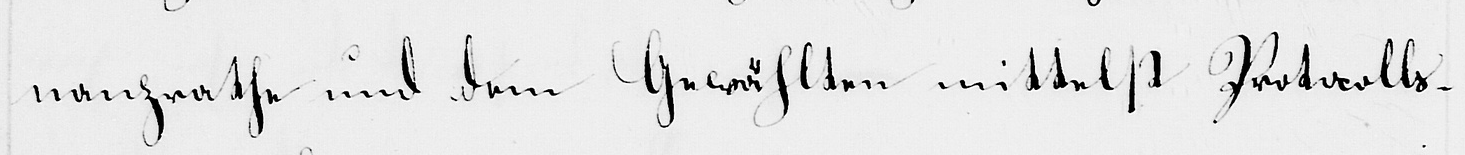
nanzrathe und dem Gewählten mittelst Protocolls¬
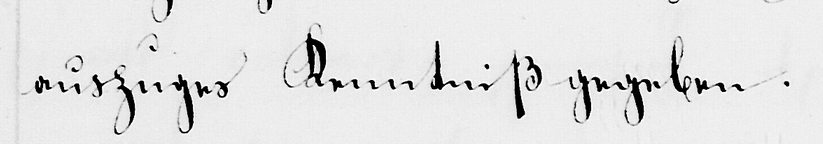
auszuges Kenntniß gegeben.
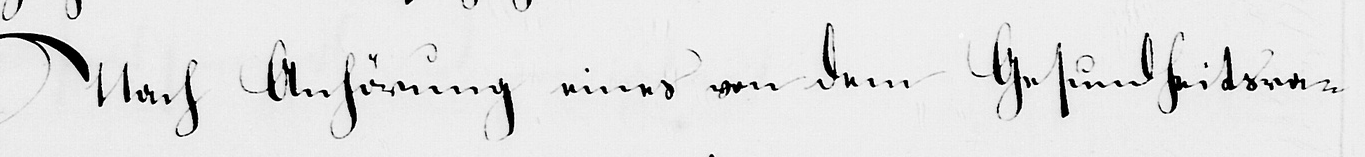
Nach Anhörung eines von dem Gesundheitsra¬
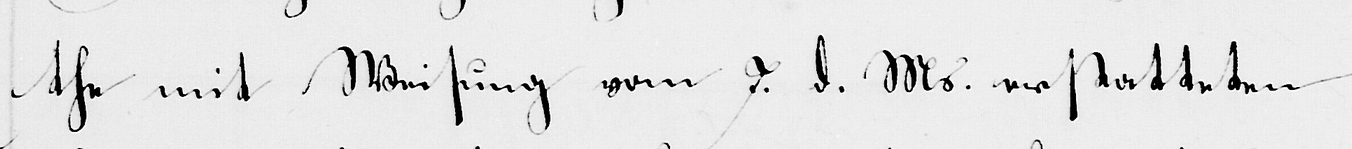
the mit Weisung vom 7. d. Ms. erstatteten
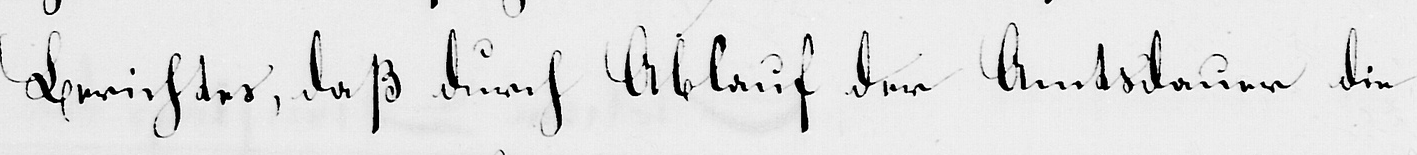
Berichtes, daß durch Ablauf der Amtsdauer die
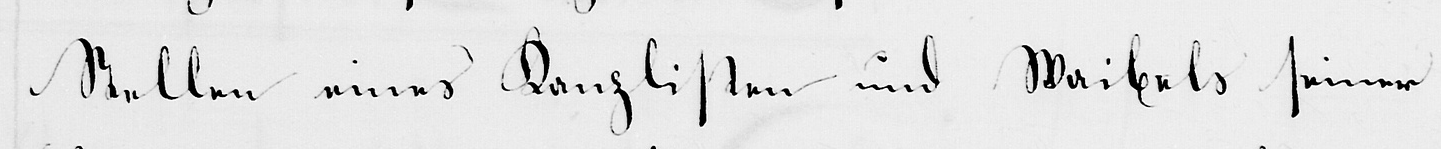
Stellen eines Kanzlisten und Waibels seiner
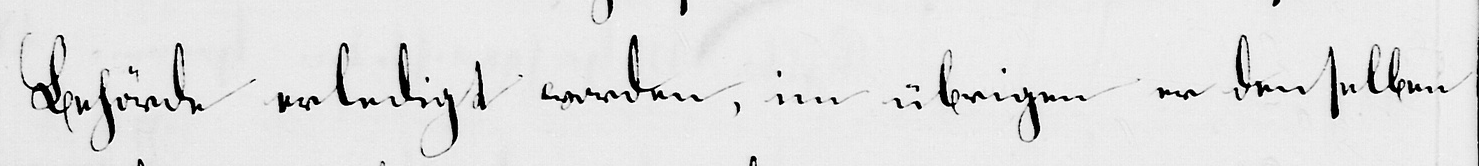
Behörde erledigt werden, im übrigen er denselben
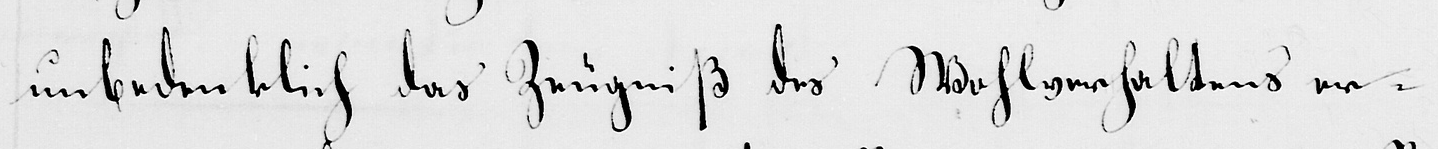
unbedenklich das Zeugniß des Wahlverhaltens er¬
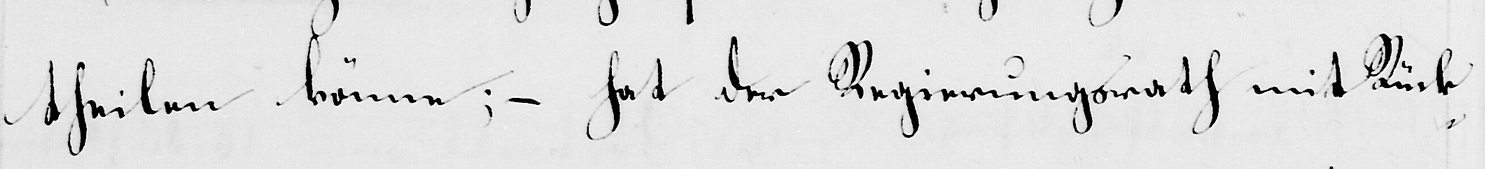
theilen könne; – hat der Regierungsrath mit Rück-
